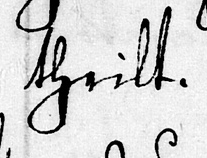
theilt.
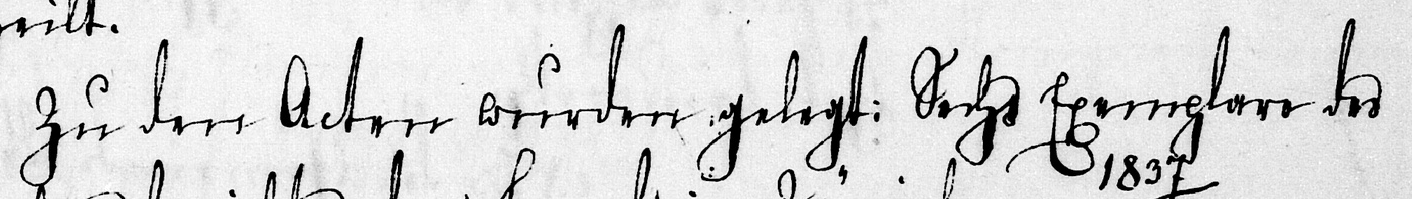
Zu den Acten wurden gelegt: Sechs Exemplare des
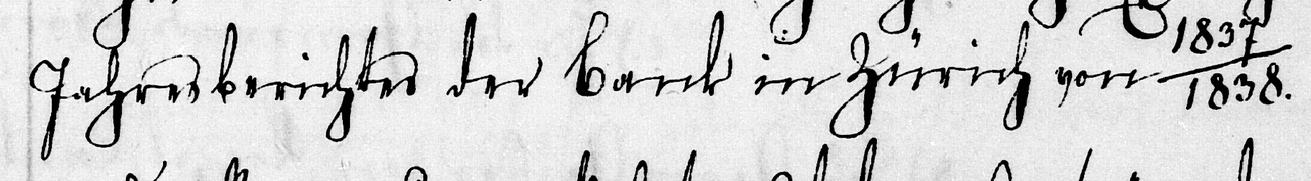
Jahresberichtes der Bank in Zürich von 1837/1838.
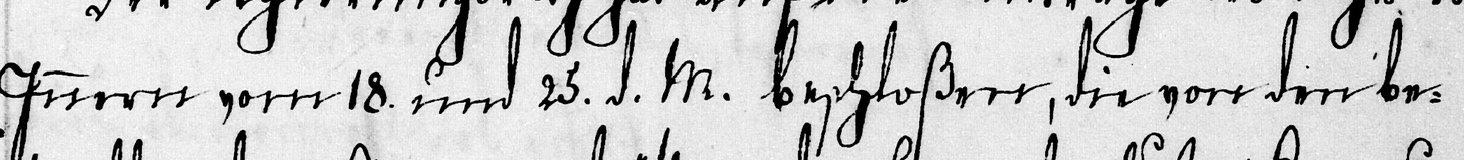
Innern vom 18. und 25. d. M. beschloßen, die von den be¬
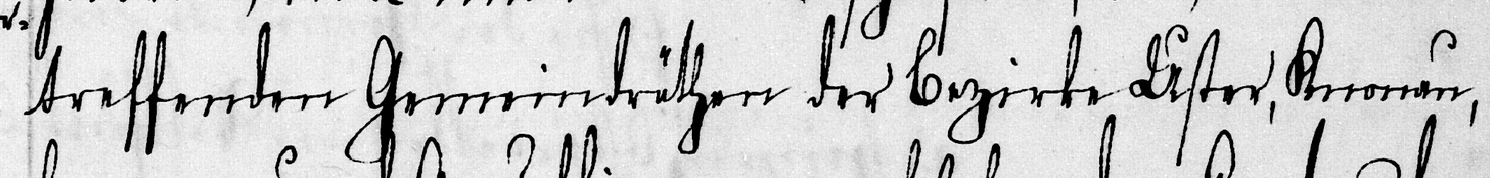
treffenden Gemeindräthen der Bezirke Uster, Knonau,
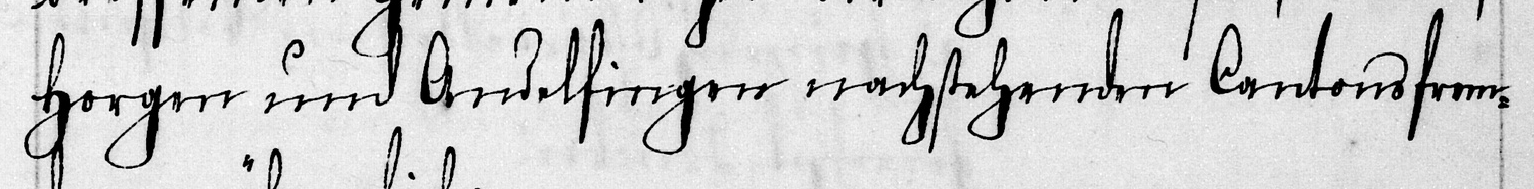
Horgen und Andelfingen nachstehenden Cantonsfrem¬
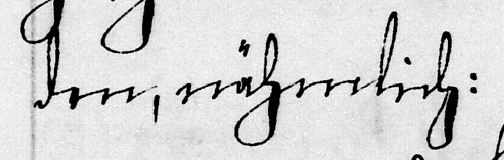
den, nähmlich:
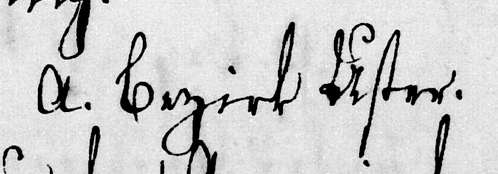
A. Bezirk Uster.
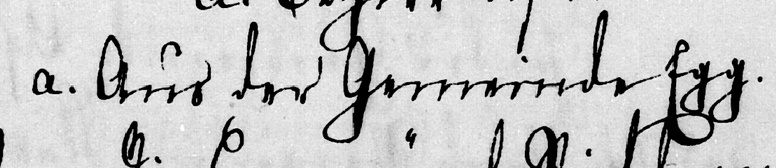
a. Aus der Gemeinde Egg.
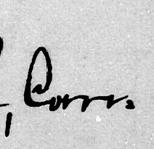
Can¬
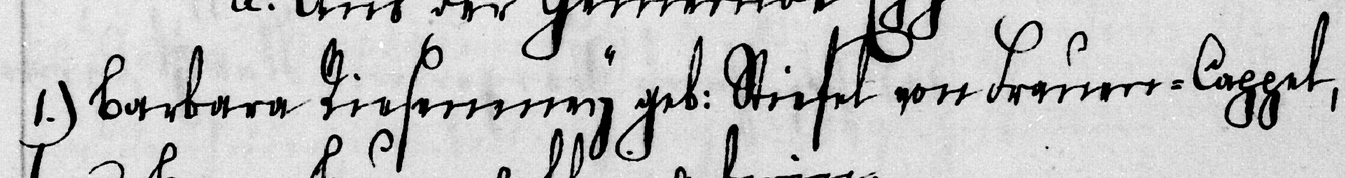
1. Barbara Riesenmey geb: Stiefel von Frauen-Cappel,
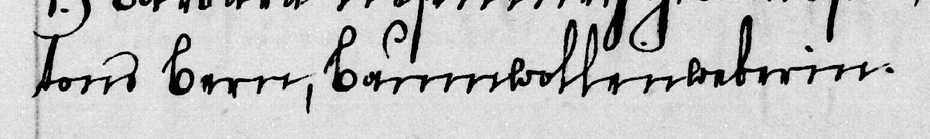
tons Bern, Baumwollenweberin.
